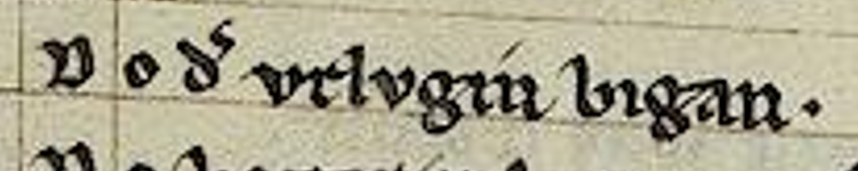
Do d(er) vrlvgin bigan.
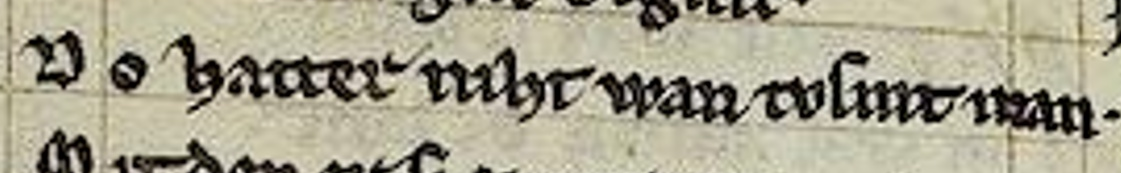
Do hatter niht wan tvſint man.
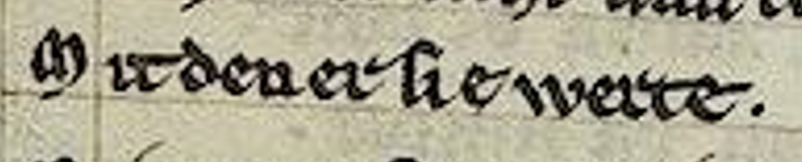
Mit den er ſi e werte.
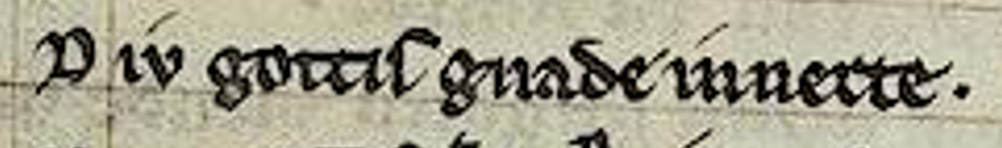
Div gottiſ gnade innerte.
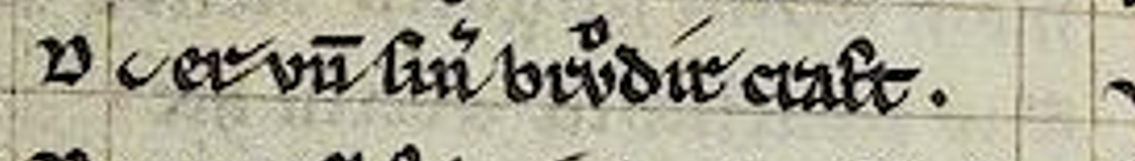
D(az) er vn(d) ſin(er) brv°odir craft.
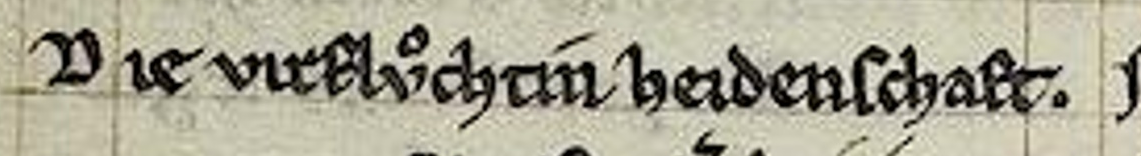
Die virflv°ochtin heidenſchaft.
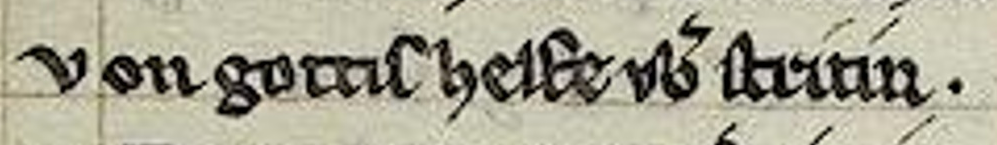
Von gottiſ helfe vb(er) ſtritin.
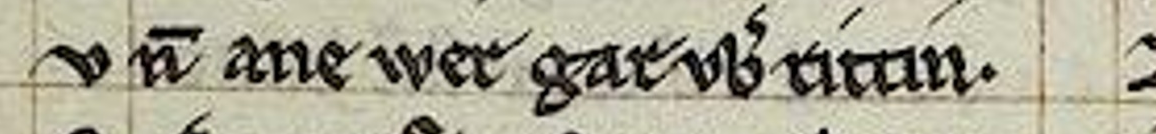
Vn(d) ane wer gar vb(er) rittin.
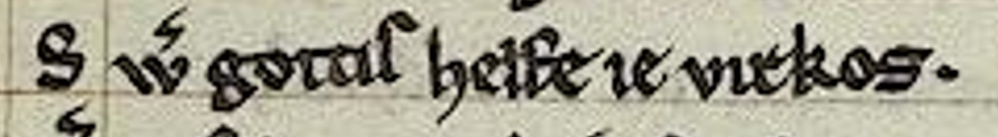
Sw(er) gottiſ helfe ie virkos.
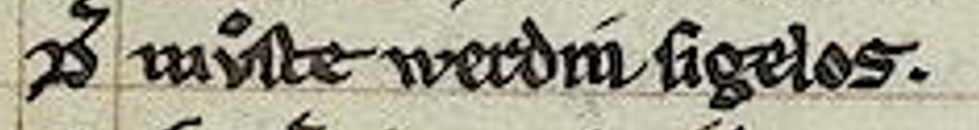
D(er) mv°oſte werdin ſigelos.
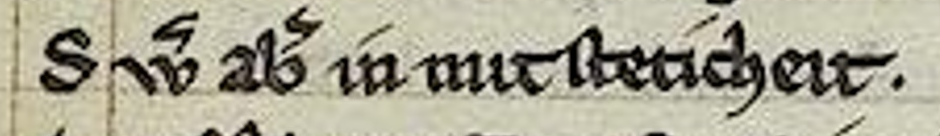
Sw(er) ab(er) in mit ſteticheit.
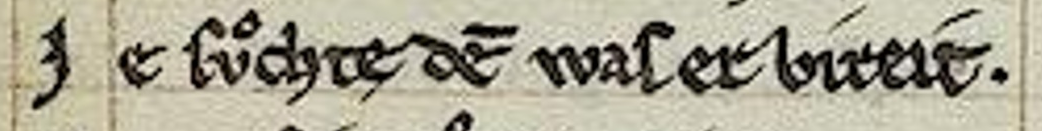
Ie ſv°ochte de(m) waſ er bireit.
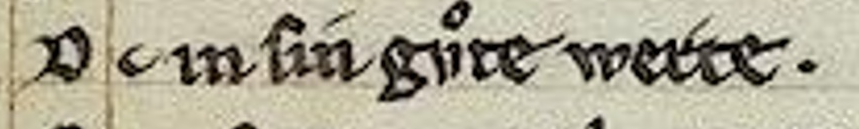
D(az) in ſin gv°ote werte.
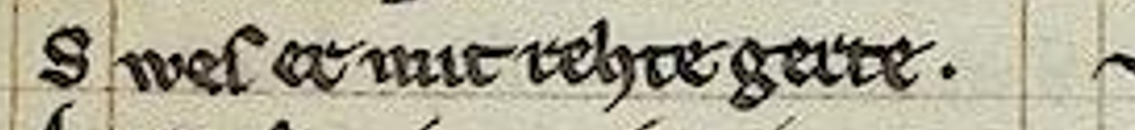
Sweſ er mit rehte gerte.
